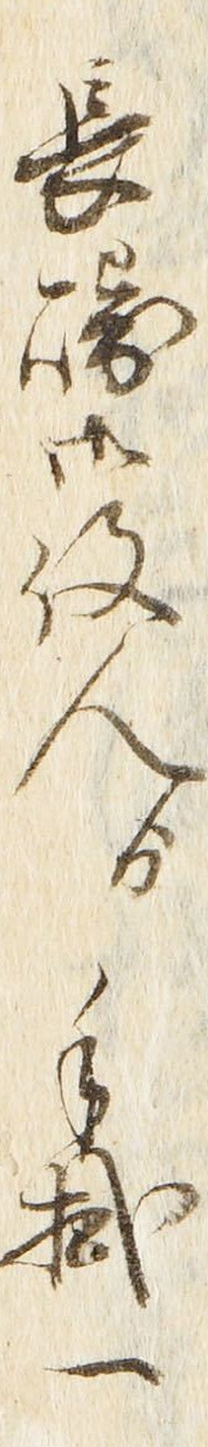長崎御役人ゟ手拭一
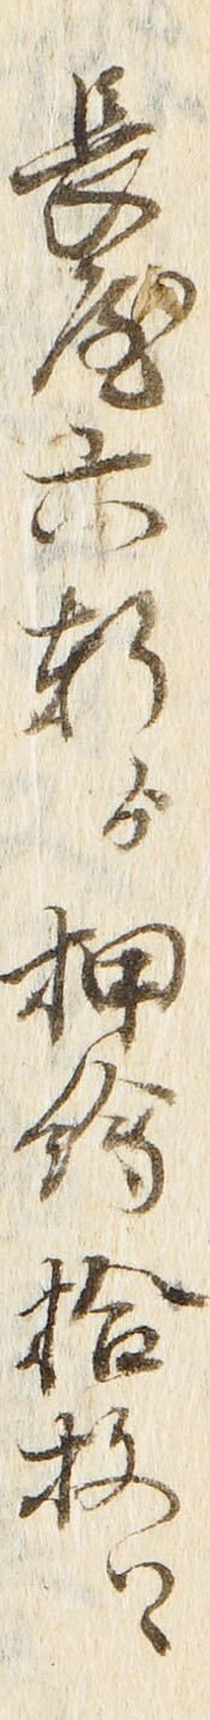長屋六軒ゟ押絵拾枚ッゝ
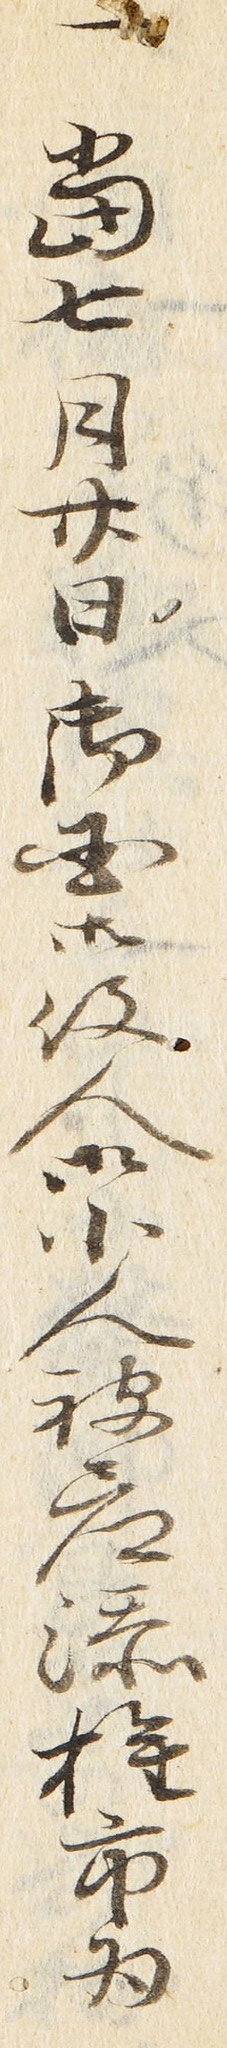一当七月廿日御国御役人御小人被差添権市為
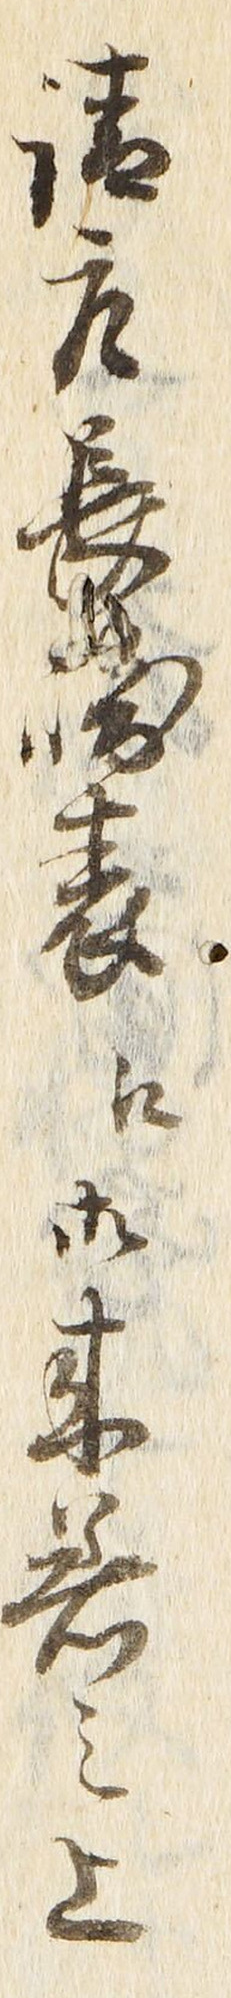請取長崎表え御来着之上
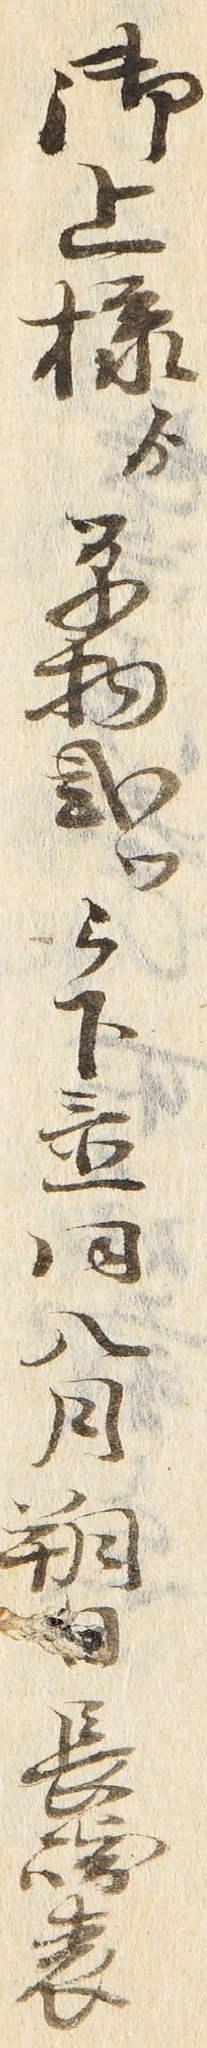御上様ゟ単物弐つ被下置同八月朔日長崎表
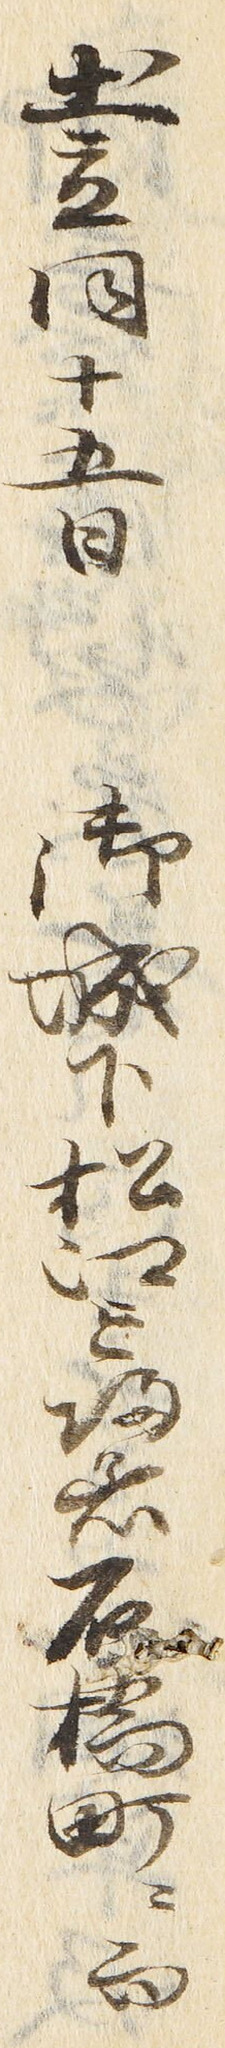出立同十五日御城下松江と帰着石橋町に而
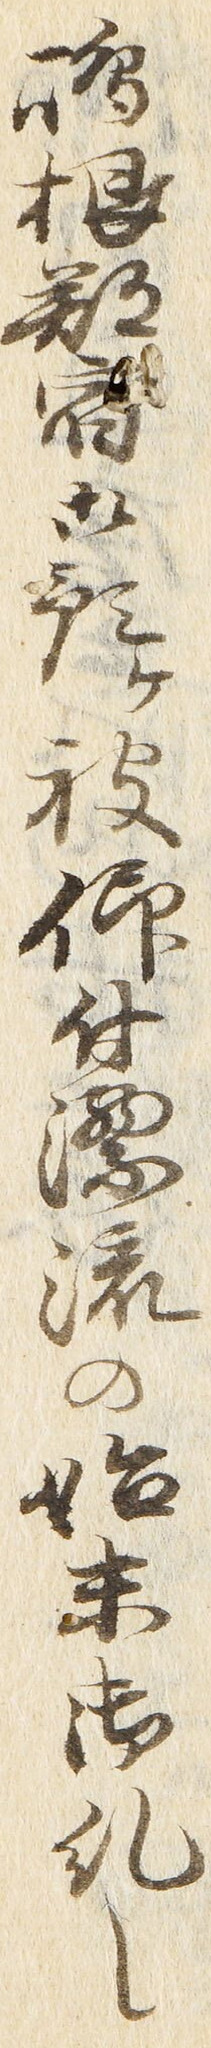嶋根郡宿御預ヶ被仰付漂流の始末御糺し
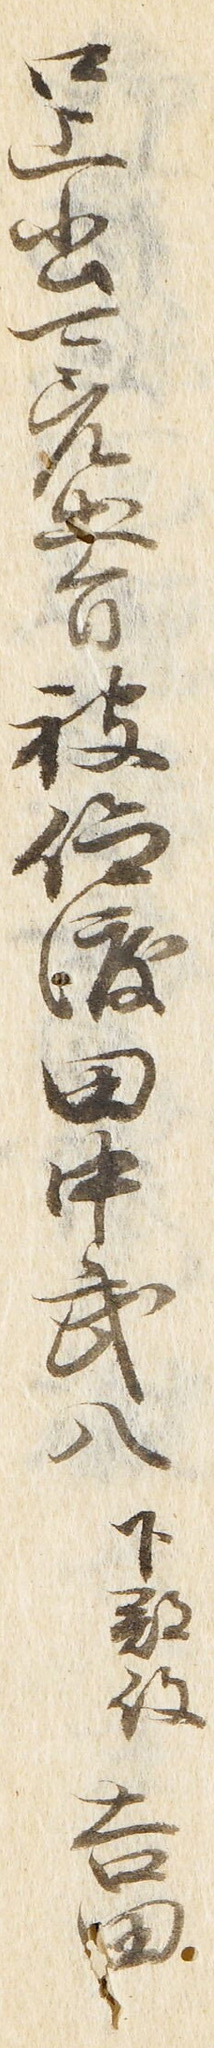口上書可差出旨被仰渡田中武八下郡役吉田
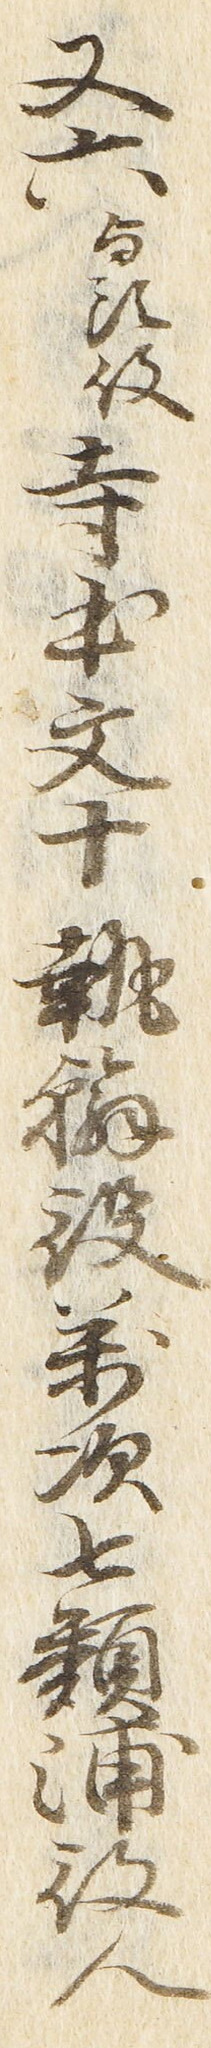又六与頭役寺本文十執翰役万次七類浦役人
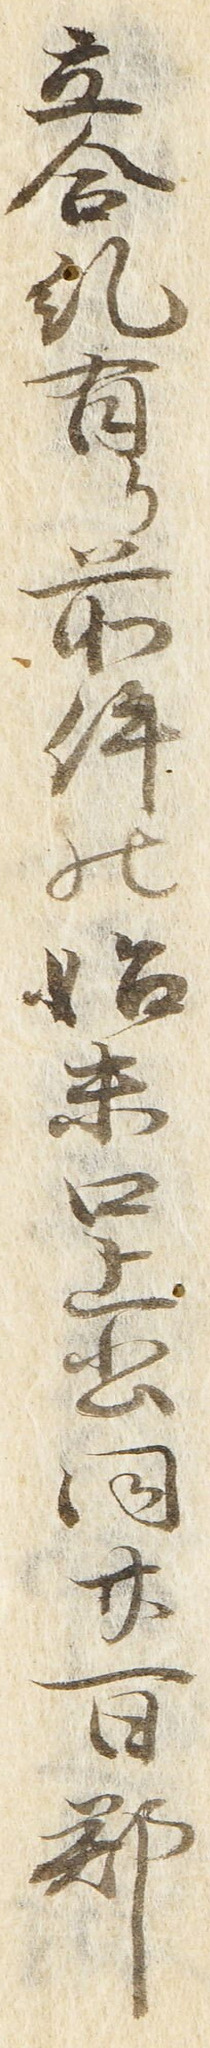立合糺有り前件の始末口上書同廿一日郡
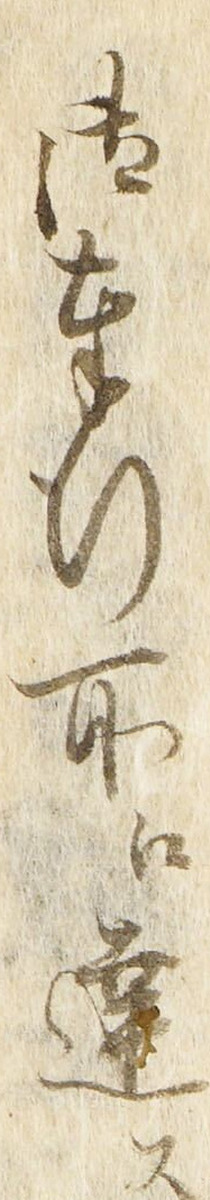御奉行所え達す

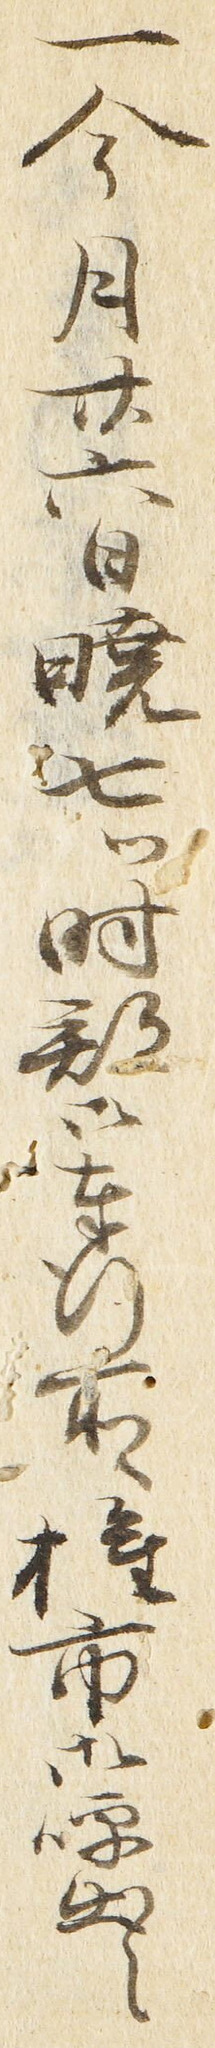一今月廿六日暁七ッ時郡御奉行所へ権市御便出し
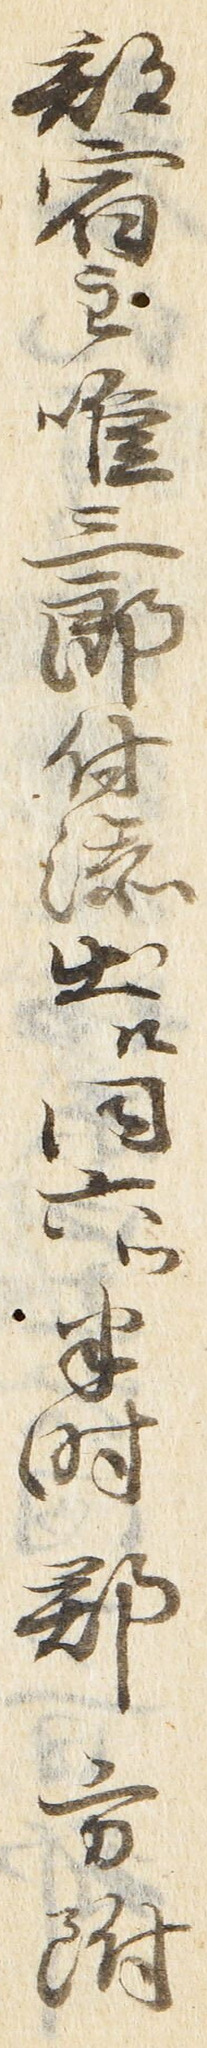郡宿主唯三郎付添出る同六ッ時半郡方附
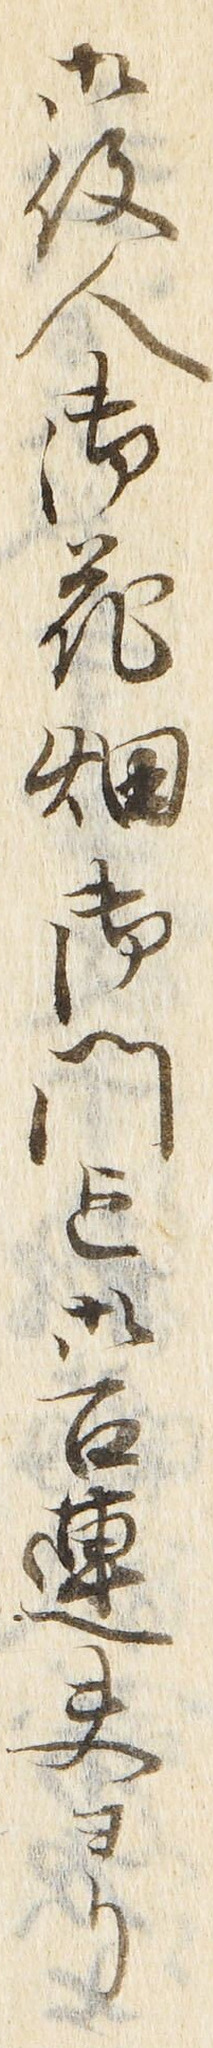御役人御花畑御門迄御召連夫より
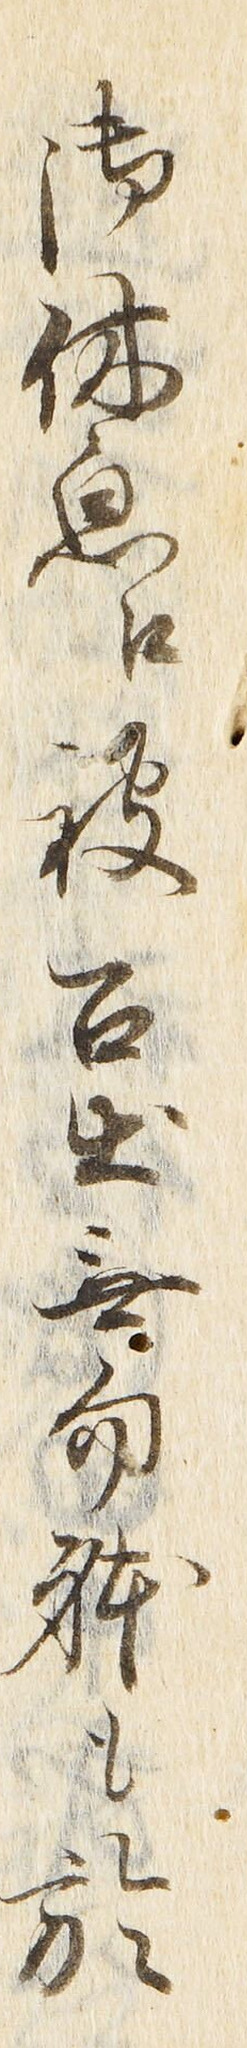御休息え被召出無勿躰も於
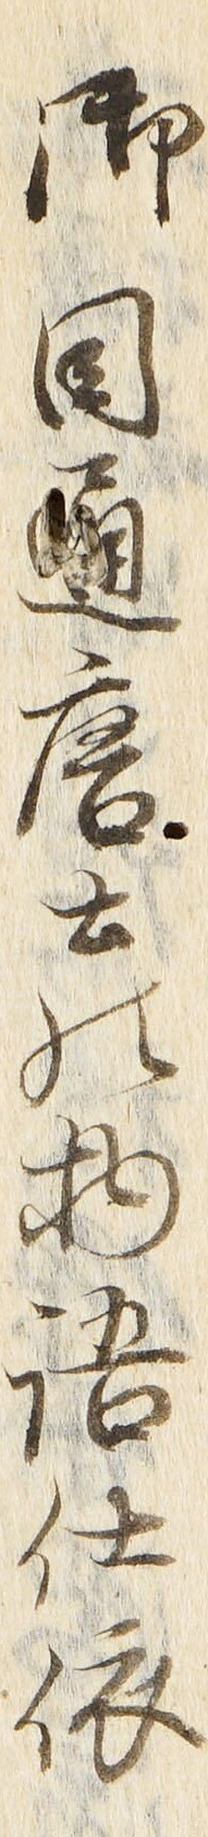御同通唐土の物語仕依
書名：唐物語
